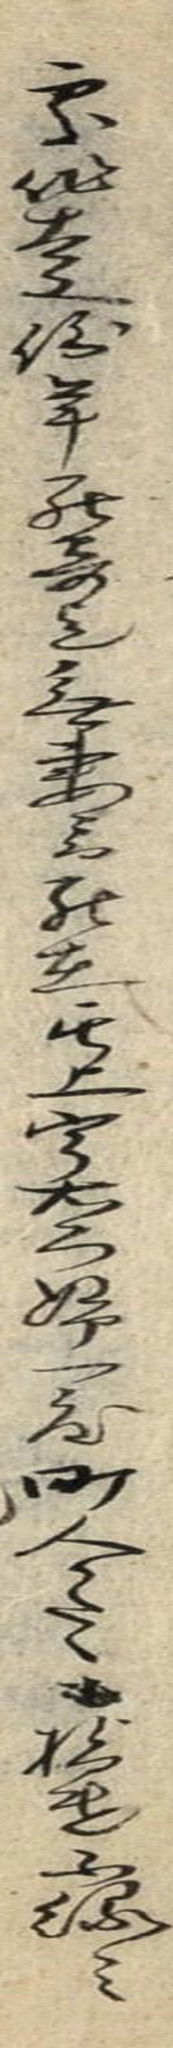処作太夫儀年罷寄迄無妻ニ而罷在其上宇右衛門姉一度町人かたへ指遣不縁之
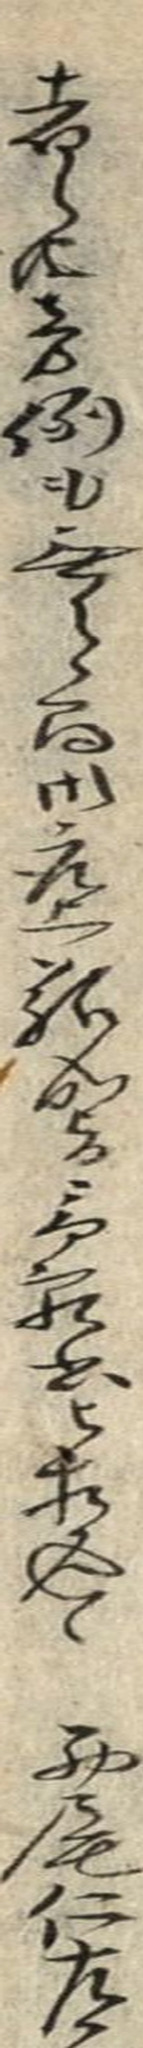者之儀旁例も無之候間御取上難成旨ニ而願書被相返候西尾仁左衛門
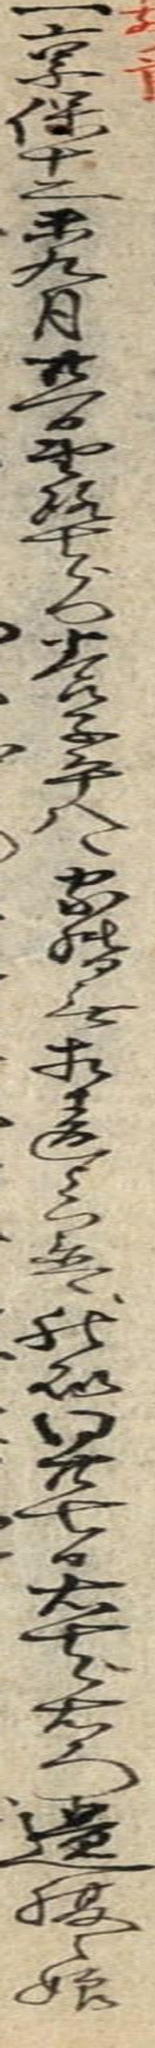一享保十二未九月廿一日野路十郎右衛門養子平八へ家督無相違被下置候然処同廿七日十郎右衛門違腹之娘
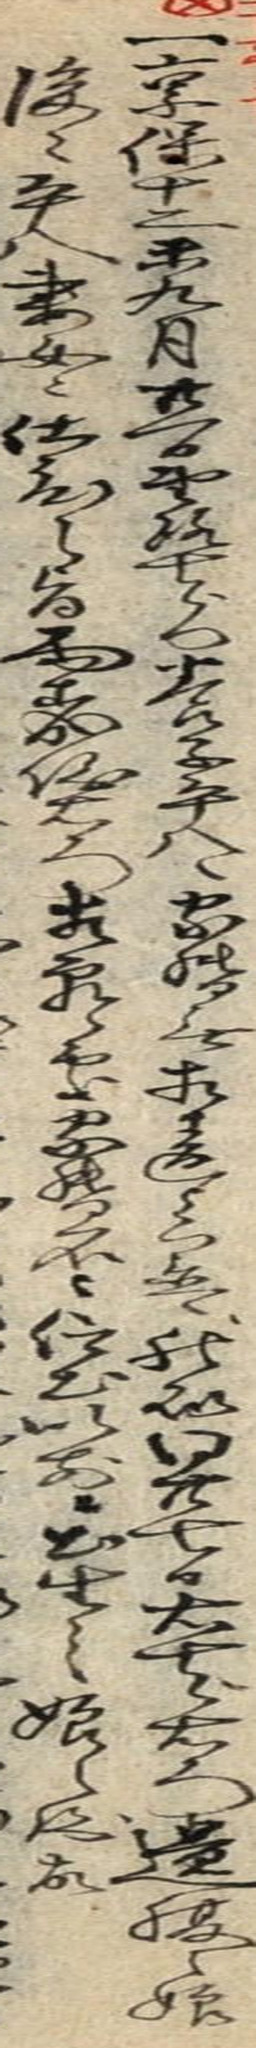後々平八妻女ニ仕度之旨雨森儀右衛門相願候処家督不被仰出以前ニ出生之娘之儀故
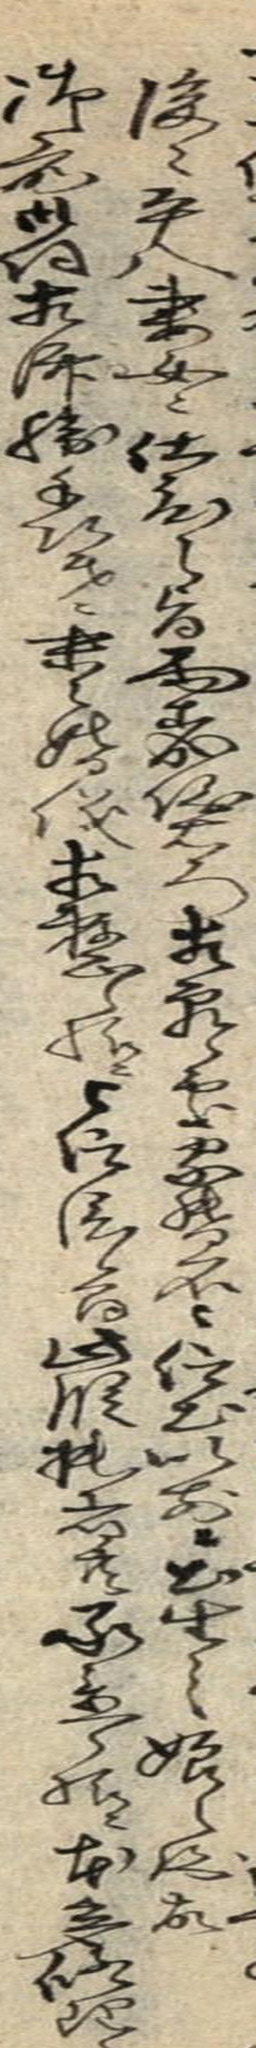御前御伺相済勝手次第ニ末々婚儀相整候様ニ被仰渡候旨此段拙者共承置候様ニ本多修理方
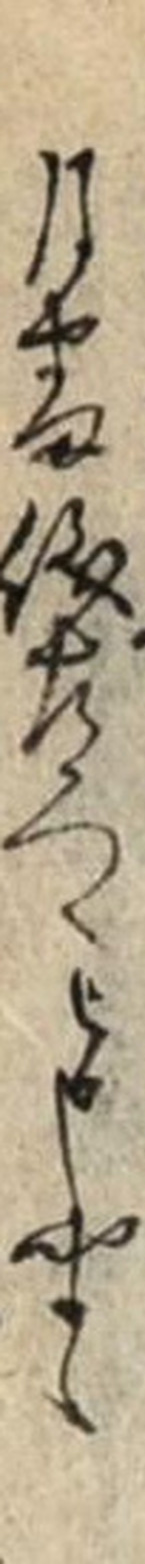月番儀左衛門へ被申聞候
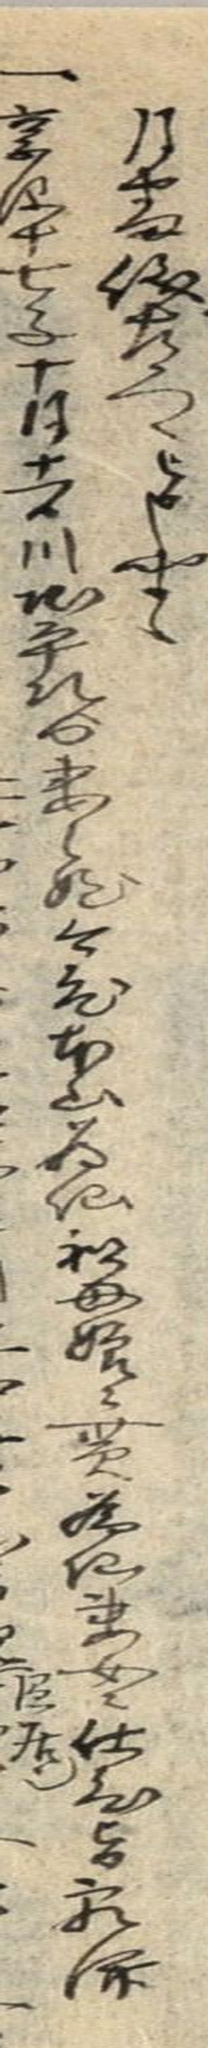一享保十七子十月十一日川地平次右衛門妻之姪今度本山為仙祖母娘ニ貰為仙妻女ニ仕度旨願済
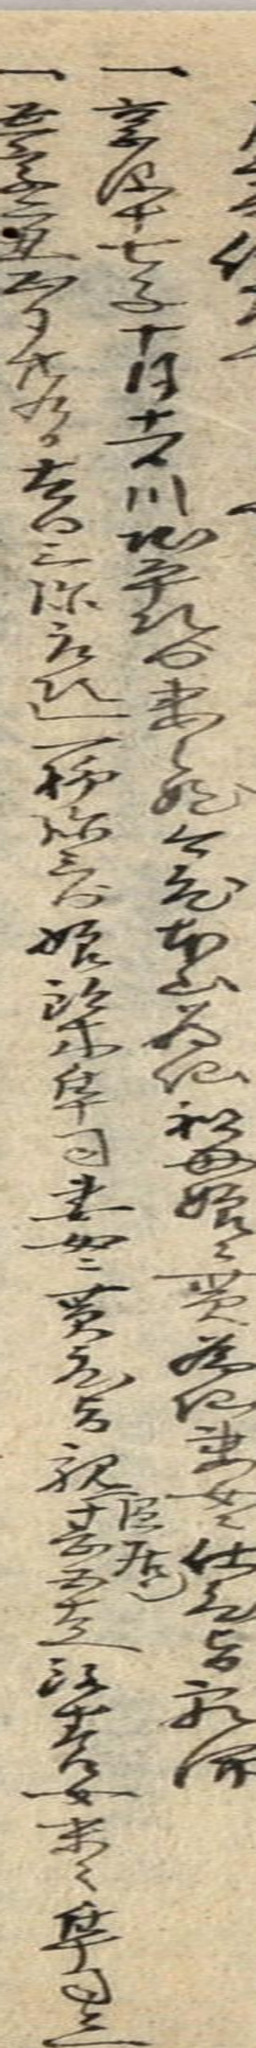一延享二丑正月廿九日太田三弥取次」一柳弥三右衛門娘鈴木隼司妻ニ貰度旨親隠居也甚五太夫致養女末々隼司ニ一
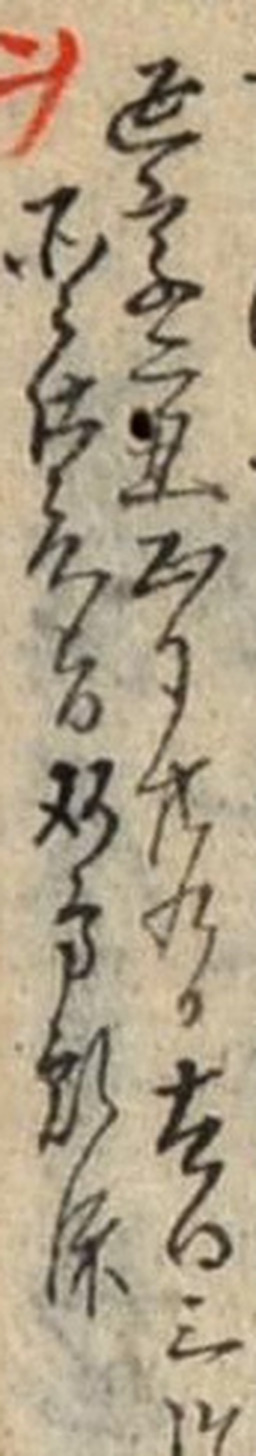所被仕度旨双方願済

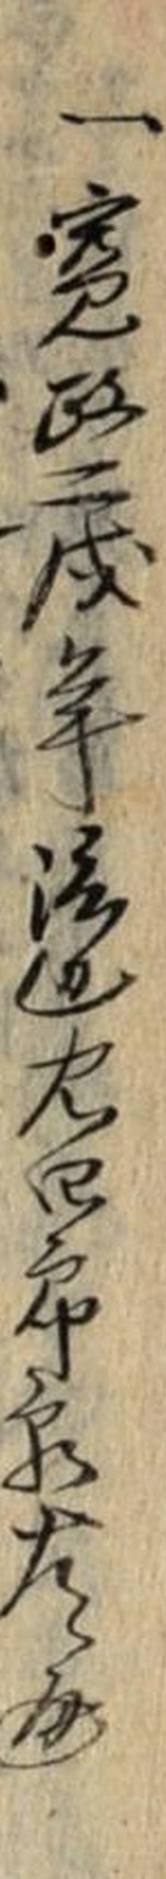一寛政二戌年渡辺忠四郎願左之通
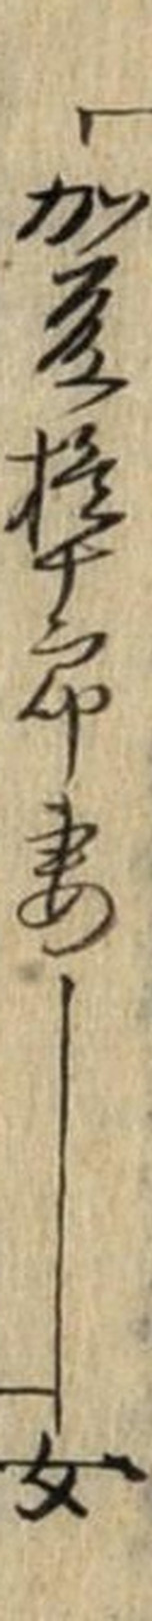加藤権十郎妻女
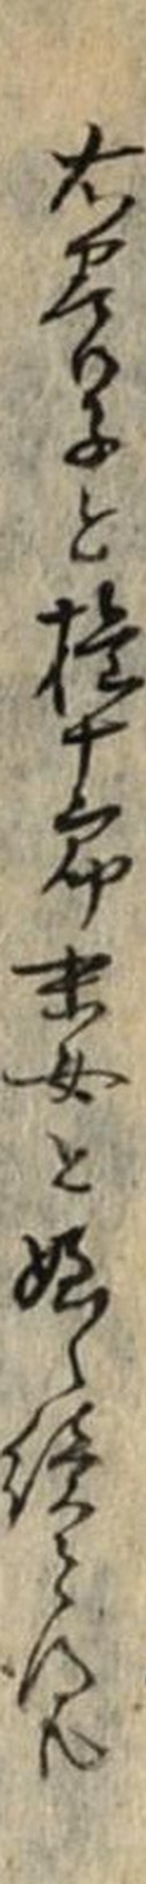右養子と権十郎末女と姪之続ニ候得共
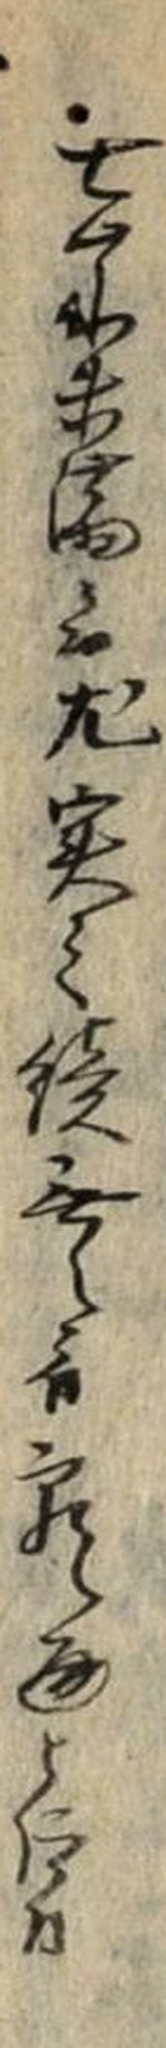七歳未満ニ而尤実之続無之ニ付願之通被仰付
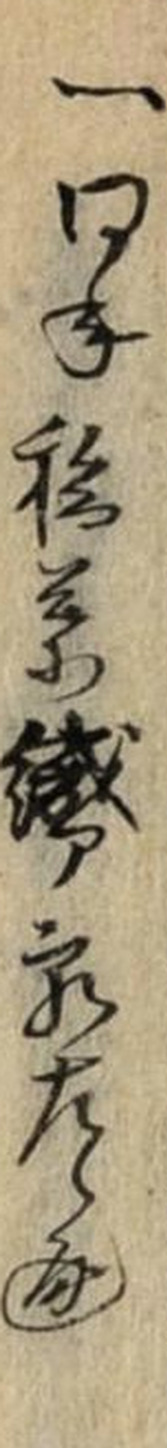一同年稲葉織部願左之通
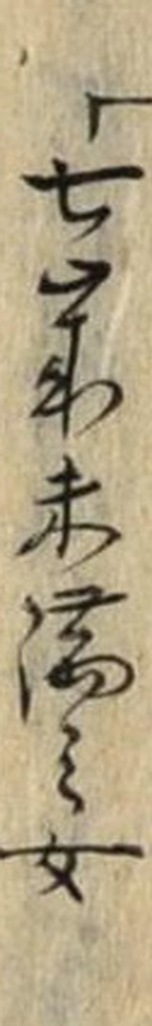七歳未満之女
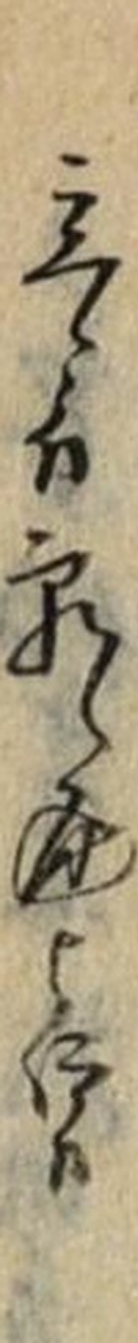立候ニ付願之通被仰付
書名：養子縁組之部
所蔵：福井県文書館 Fukui Prefectural Archives
